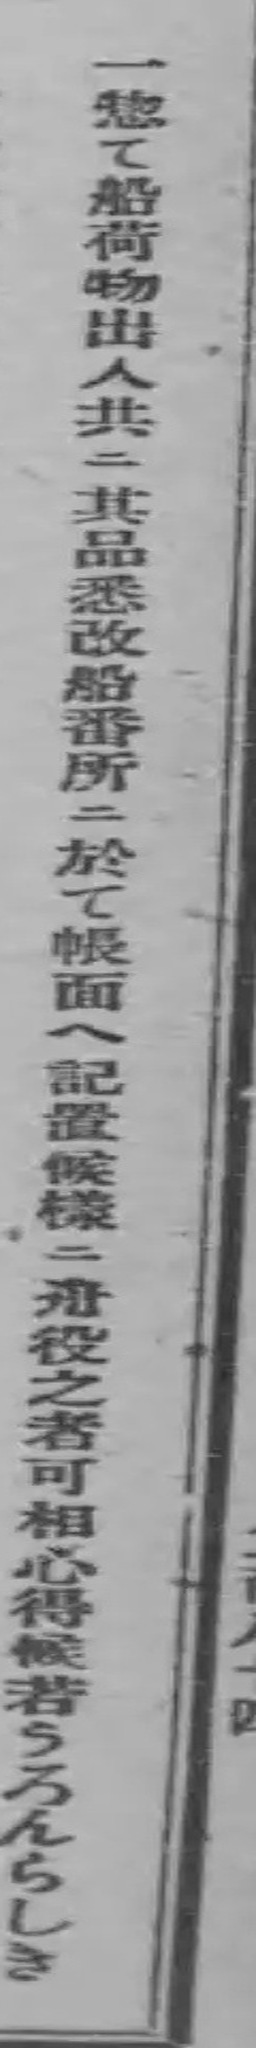一惣て船荷物出入共ニ其品悉改船番所ニ於て帳面へ記置候様ニ舟役之者可相心得候若うろんらしき
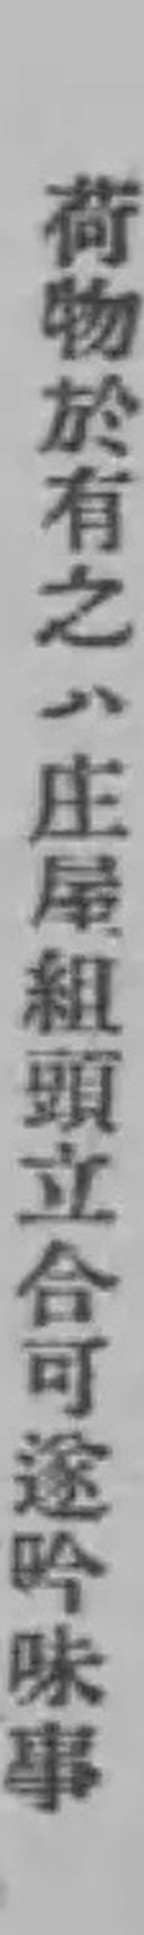荷物於有之は庄屋組頭立合可遂吟味事
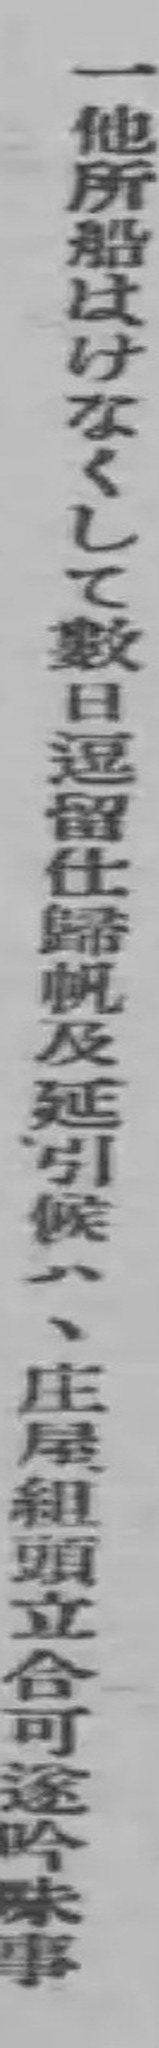一他所船はけなくして数日逗留仕帰帆及延引候はヽ庄屋組頭立合可遂吟味事
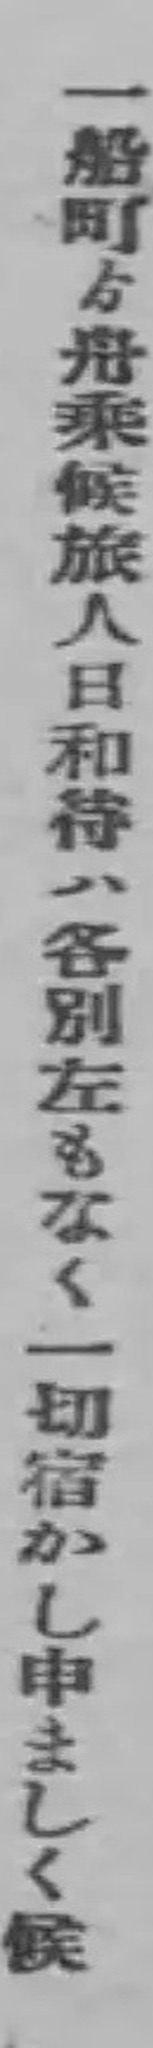一船町ゟ舟乗候旅人日和待は各別左もなく一切宿かし申ましく候
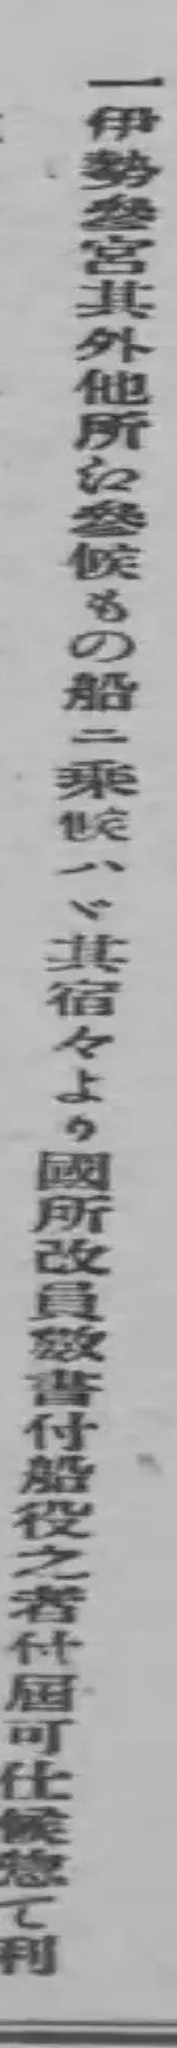一伊勢参宮其外他所え参候もの船ニ乗候はゞ其宿々より国所改員数書付船役之者付届可仕候惣て利
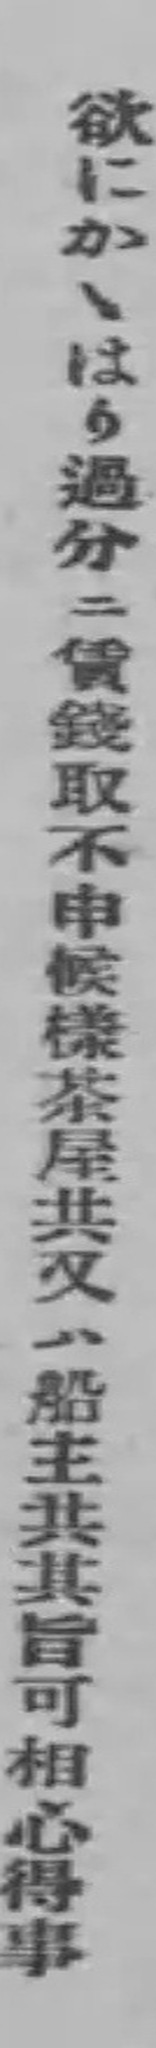欲にかゝはり過分ニ賃銭取不申候様茶屋共又は船主共其旨可相心得事
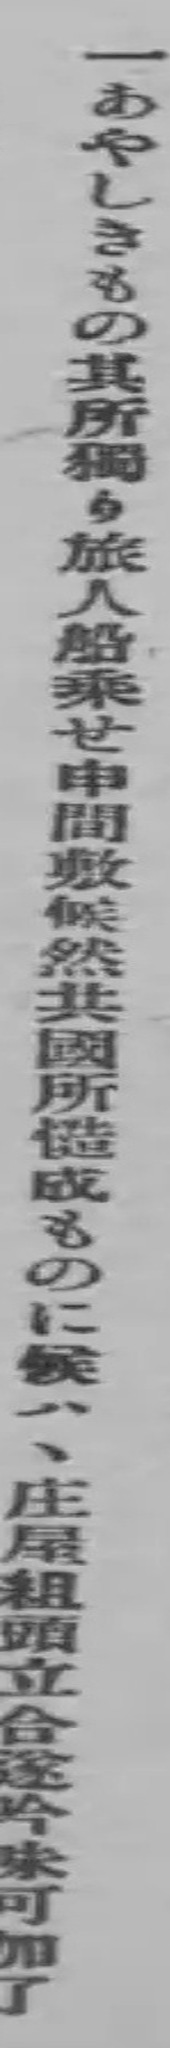一あやしきもの其所独り旅人船乗せ申間敷候然共国所慥成ものに候はゝ庄屋組頭立合遂吟味可加了
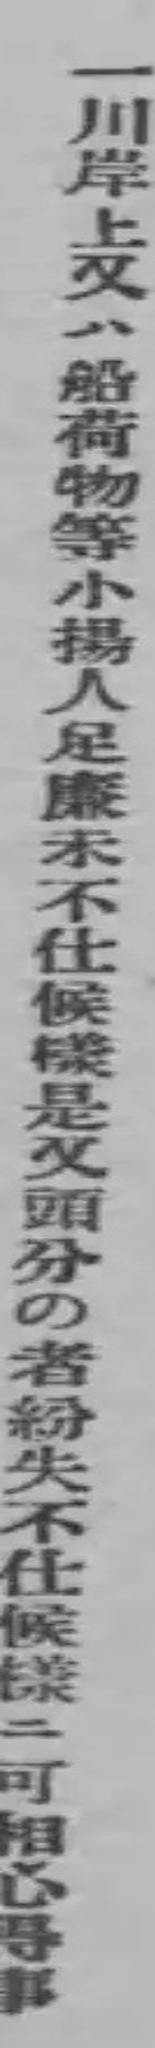一川岸上又は船荷物等小揚人足廉未不在候様是又頭分の者紛失不仕様ニ可相心得事
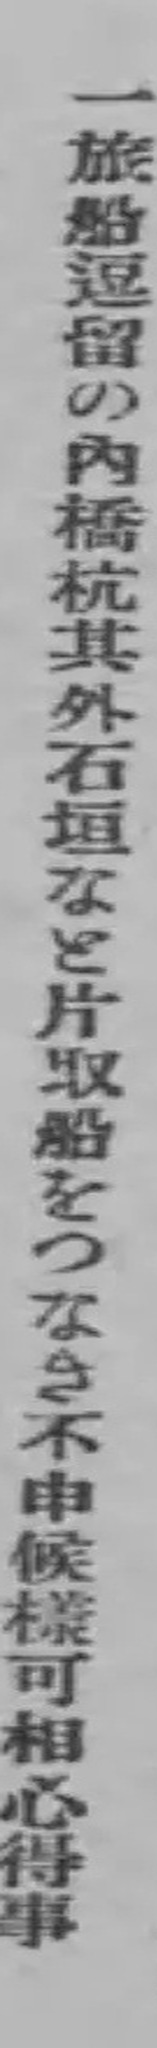一旅船逗留の内橋杭其外石垣なと片取船をつなき不申候様可相心得事
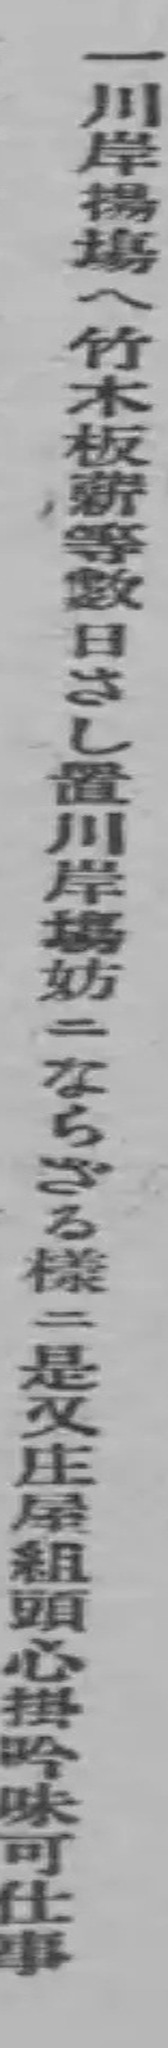一川岸揚場へ竹木板薪等数日さし置川岸場妨ニならざる様ニ是又庄屋組頭心掛吟味可仕事
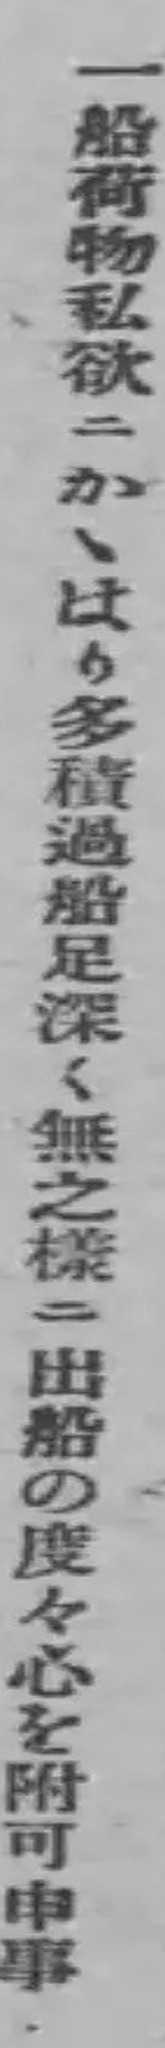一船荷物私欲ニかゝはり多積過船足深く無之様ニ出船の度々心を附可申事
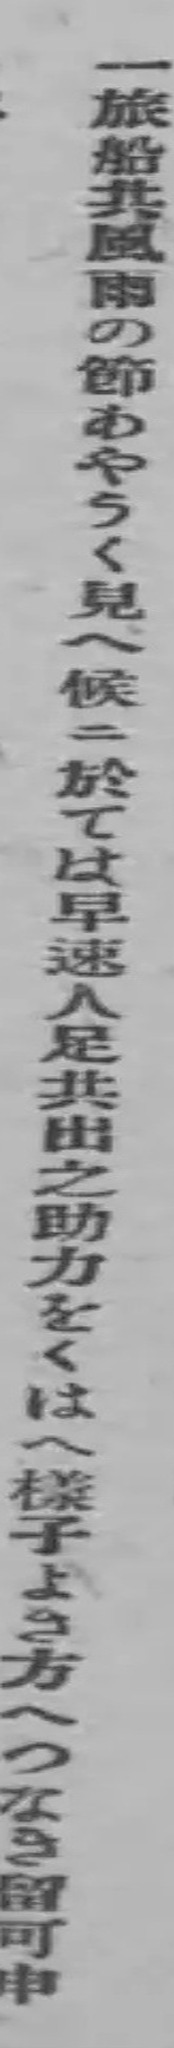一旅船共風雨の節あやうく見へ候ニ於ては早速人足共出之助力をくはへ様子よき方へつつなき留可申
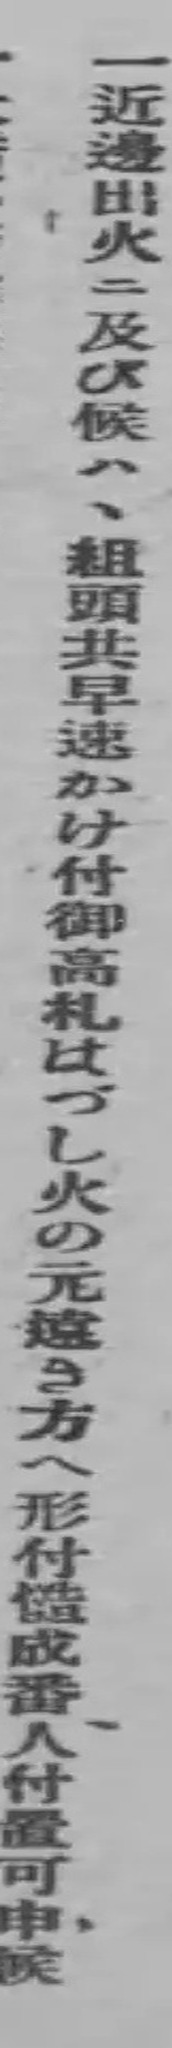一近辺出火ニ及び候はゝ組頭共早速かけ付御高札はづし火の元遠き方へ形付慥成番人付置可申候
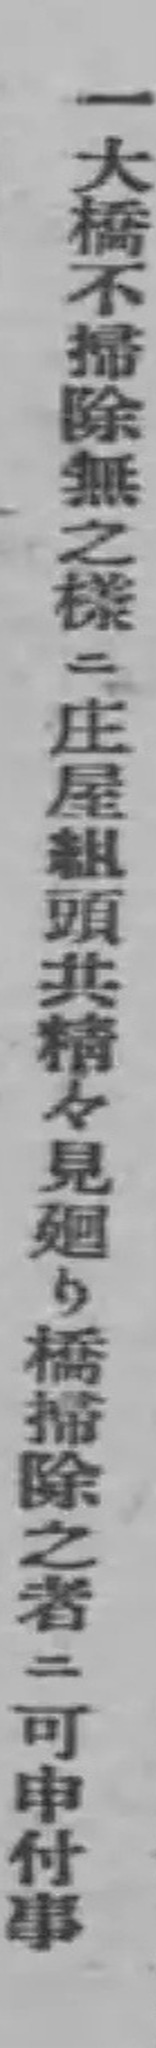一大橋不掃除無之様ニ庄屋組頭共精々見廻り橋掃除之者ニ可申付事
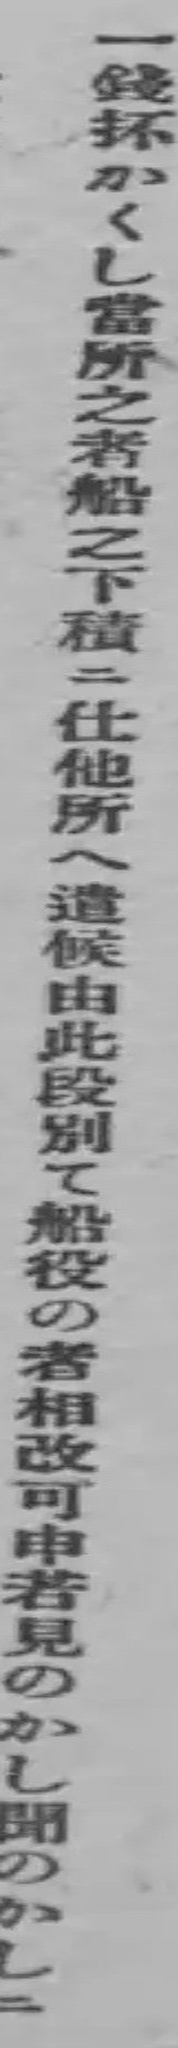一銭抔かくし当所之者船之下積ニ仕他所へ遣候由此段別て船役の者相改可申若見のかし聞のかしニ
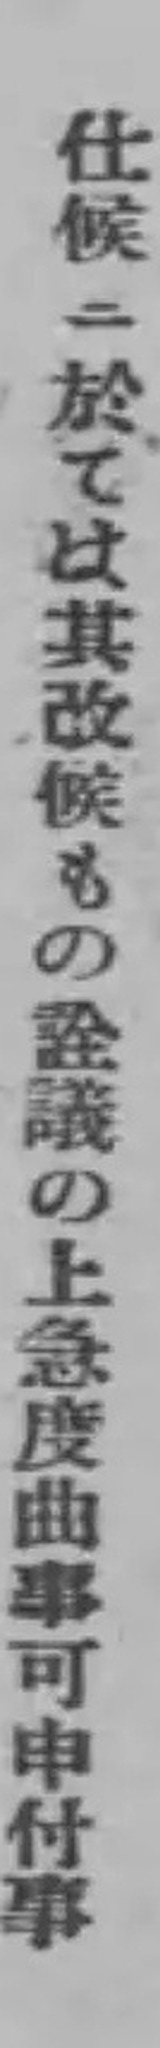仕候ニ於ては其改候もの詮議の上急度曲事可申付事
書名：豊橋市史談
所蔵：国立国会図書館 National Diet Library, JAPAN
